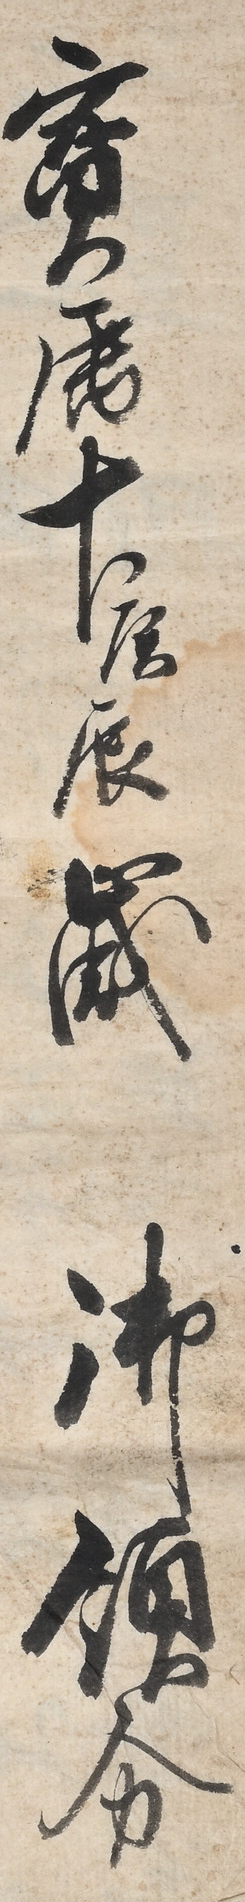宝暦十庚辰歳御領分
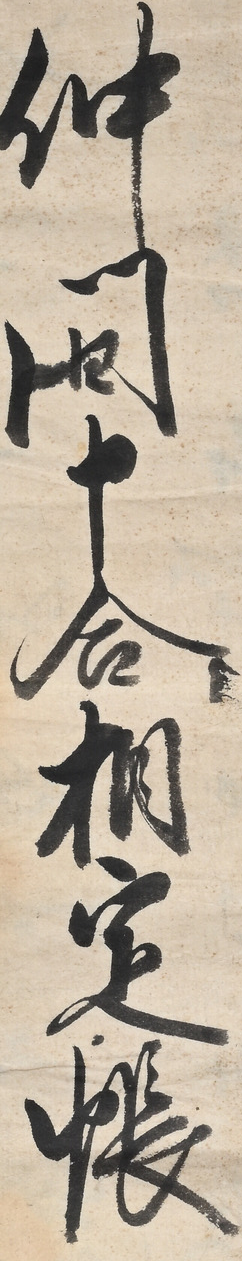仲間申合相定帳
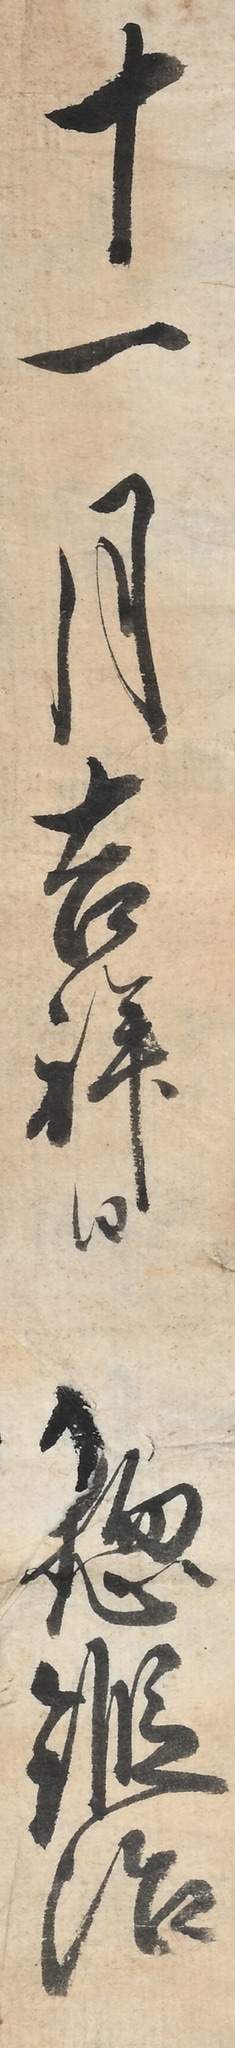十一月吉祥日惣鍛冶
